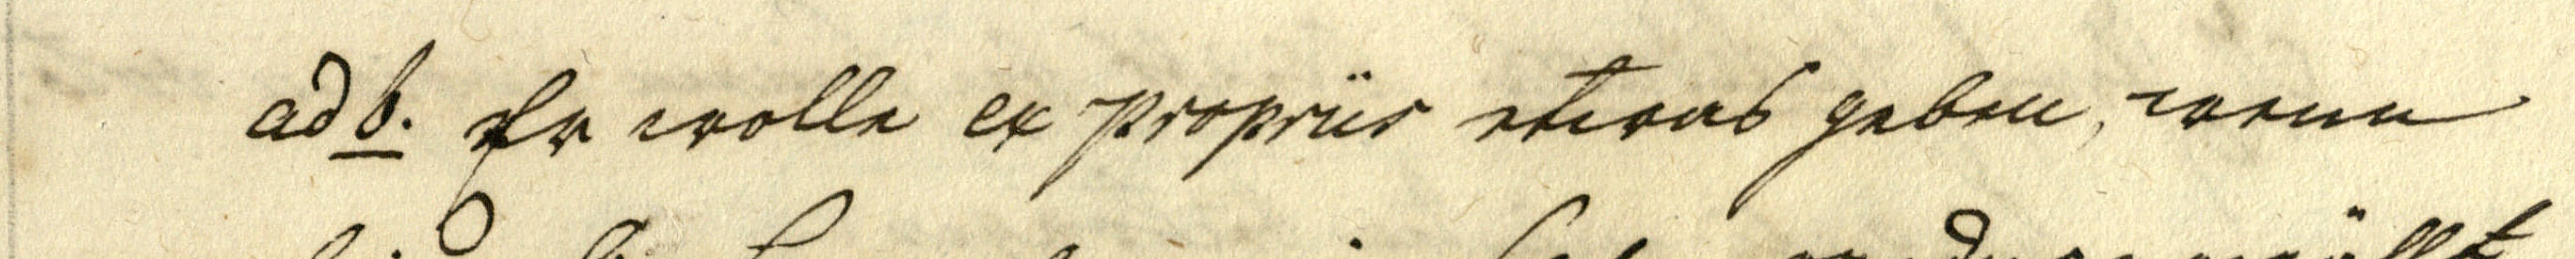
ad b. Er wolle ex propriis etwas geben, wenn
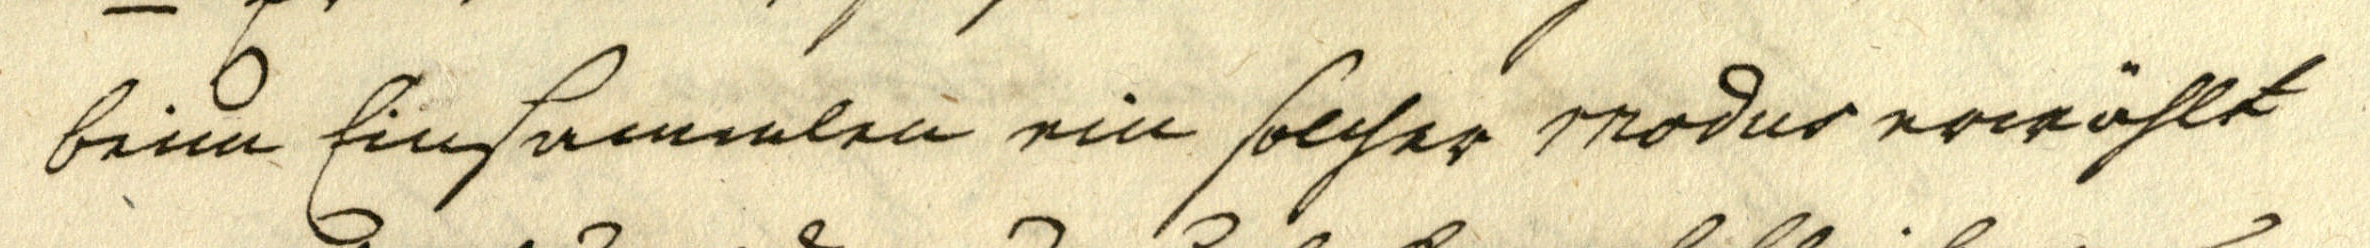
beim Einsammeln ein solcher modus erwählt
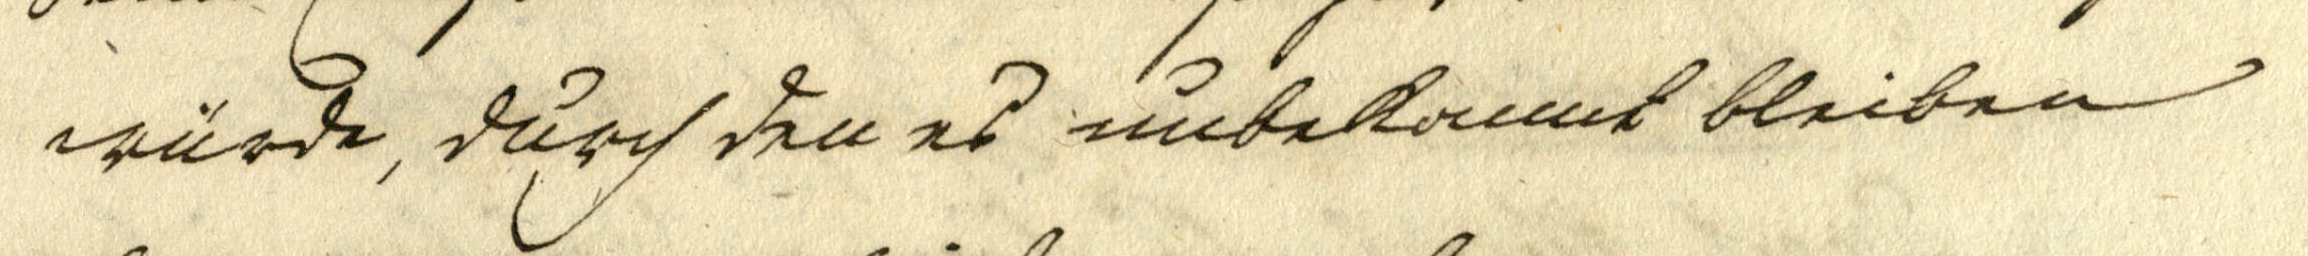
würde, durch den es unbekannt bleiben
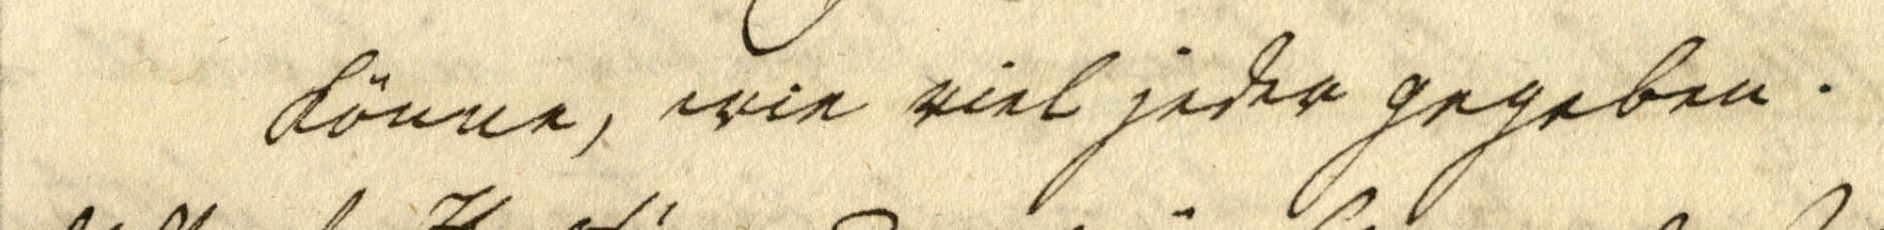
könne, wie viel jeder gegeben.
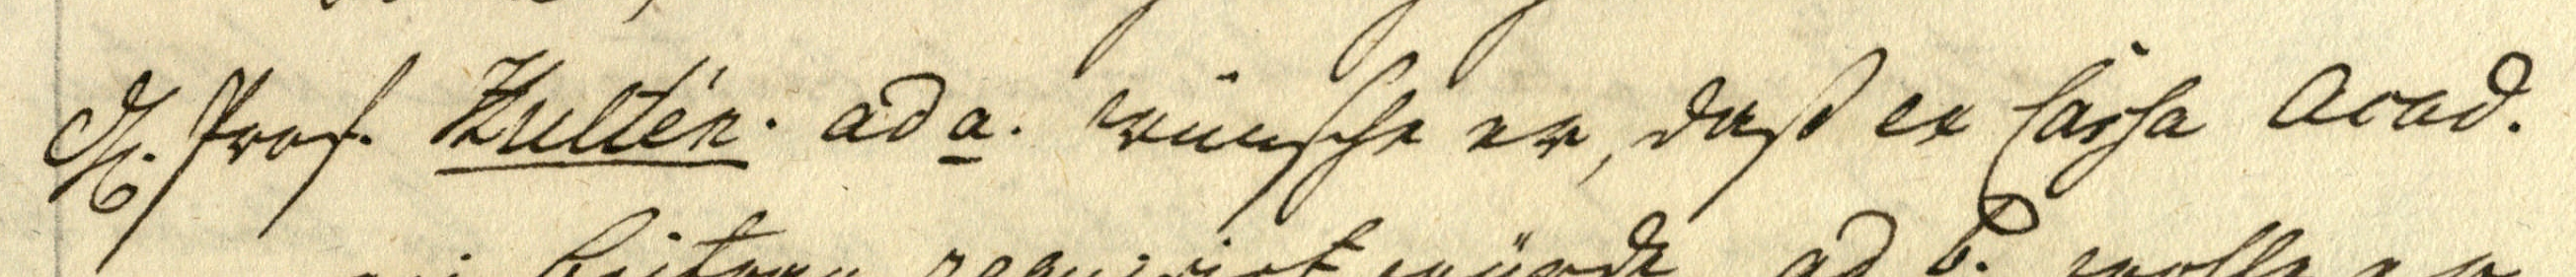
dh. Prof. Hultén. ad a. wünsche er, daß ex Cassa Acad.
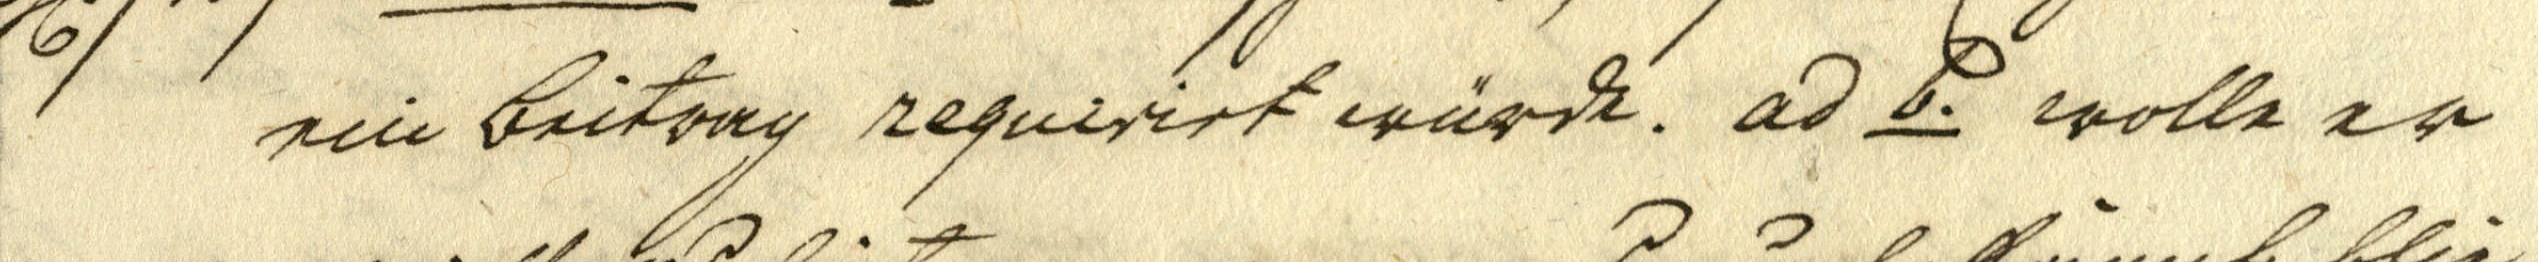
ein Beitrag requirirt würde. ad b. wolle er
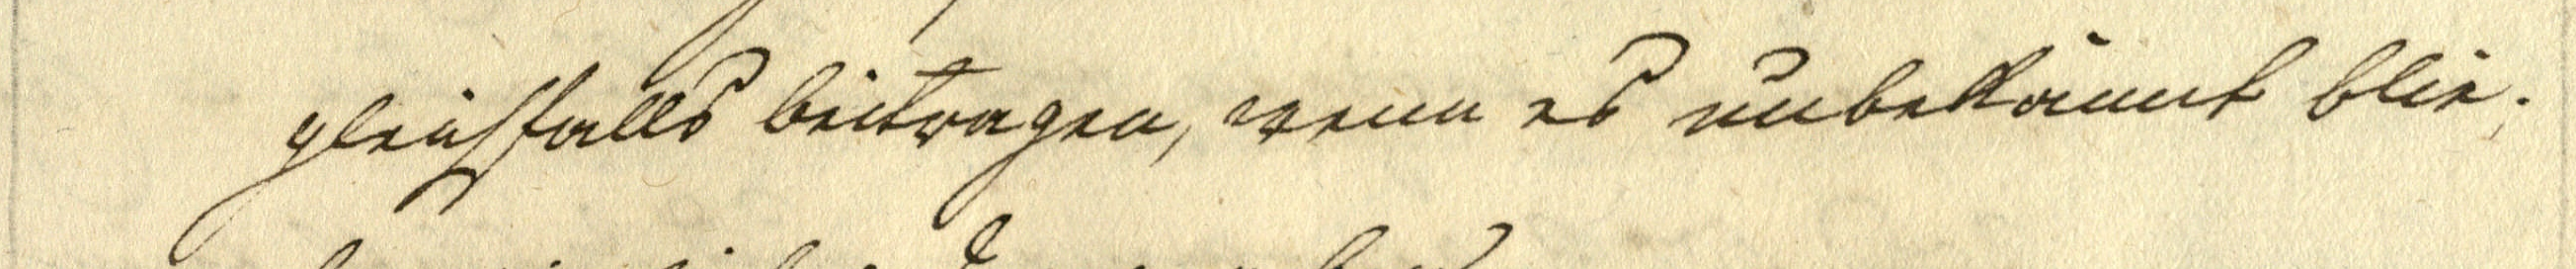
gleichfalls beitragen, wenn es unbekannt blie-
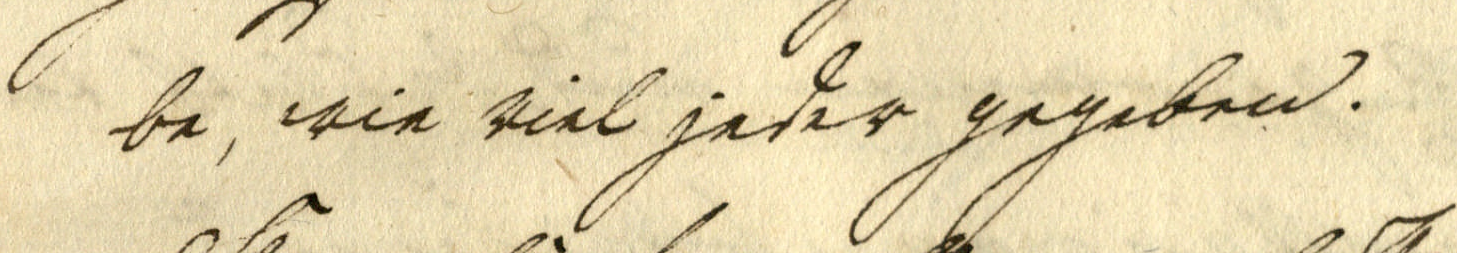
be, wie viel jeder gegeben.
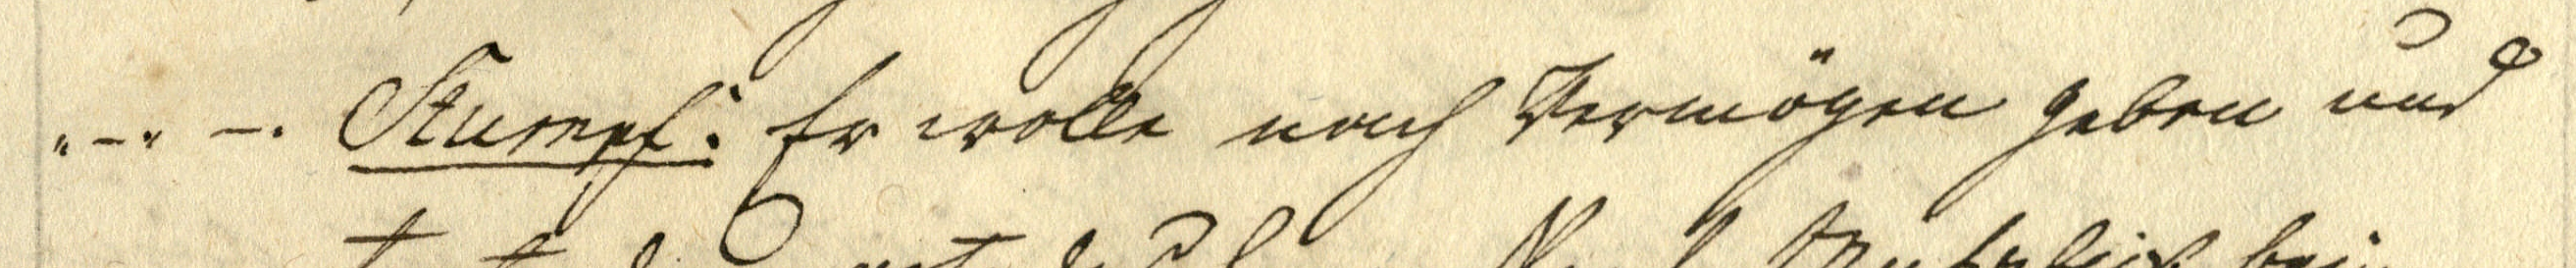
" - " - . Stumpf: Er wolle nach Vermögen geben und
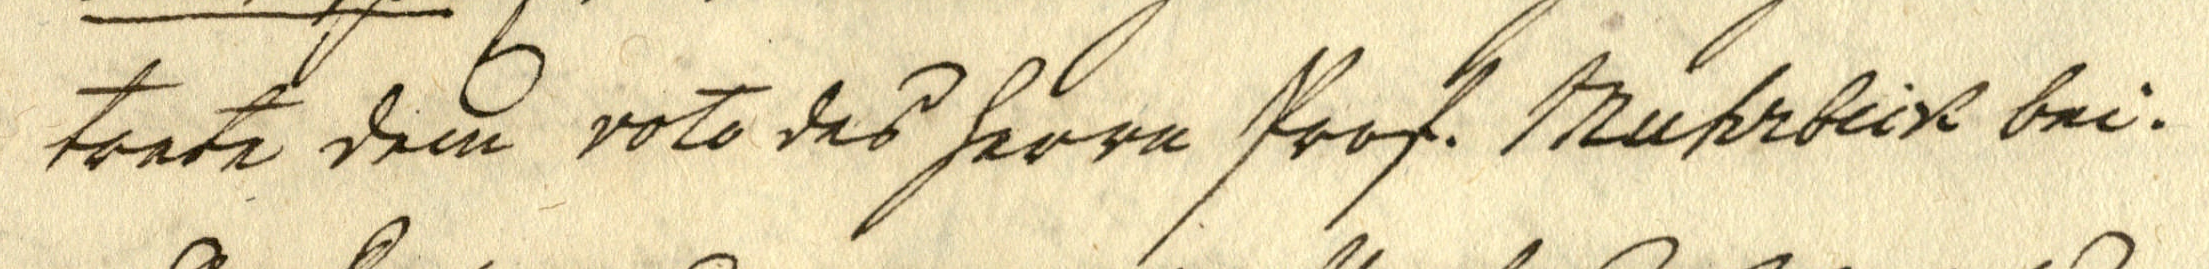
trete dem voto des herrn Prof. Muhrbeck bei.
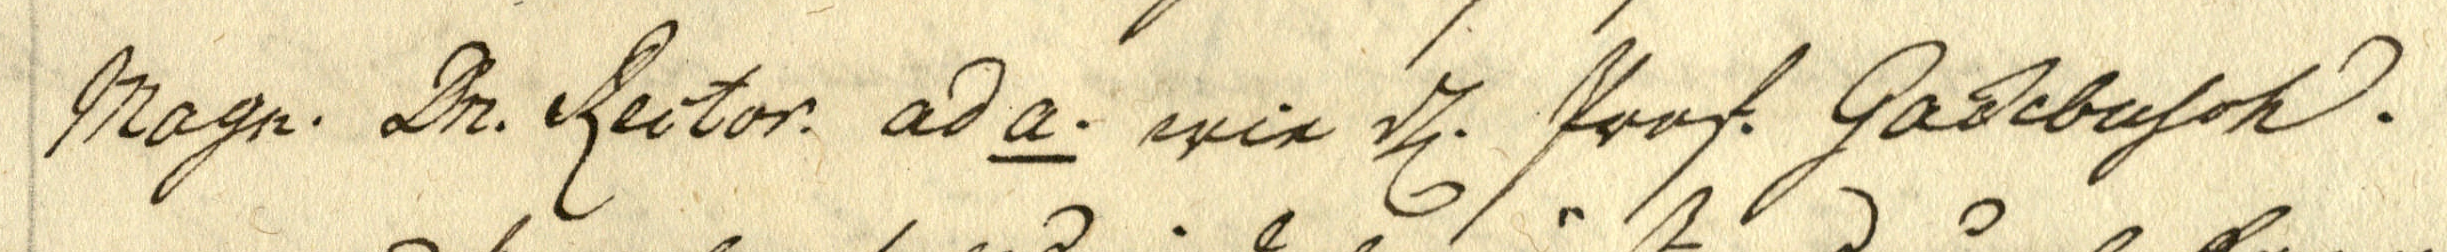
Magn. Dn. Rector: ad a. wie dh. Prof. Gadebusch.
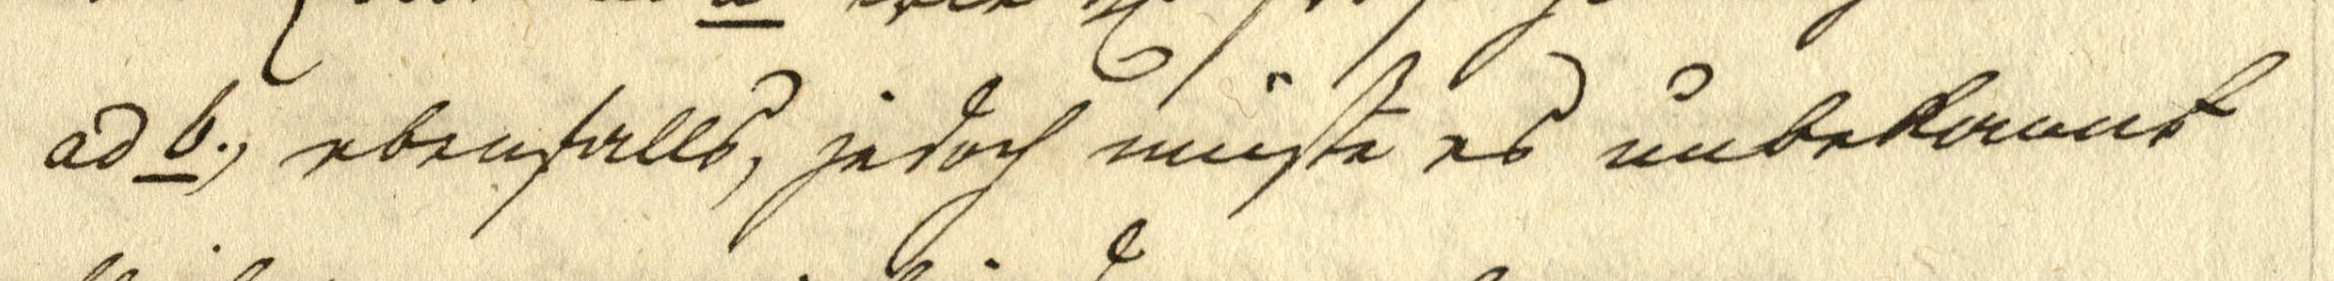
ad b., ebenfalls, jedoch müßte es unbekannt
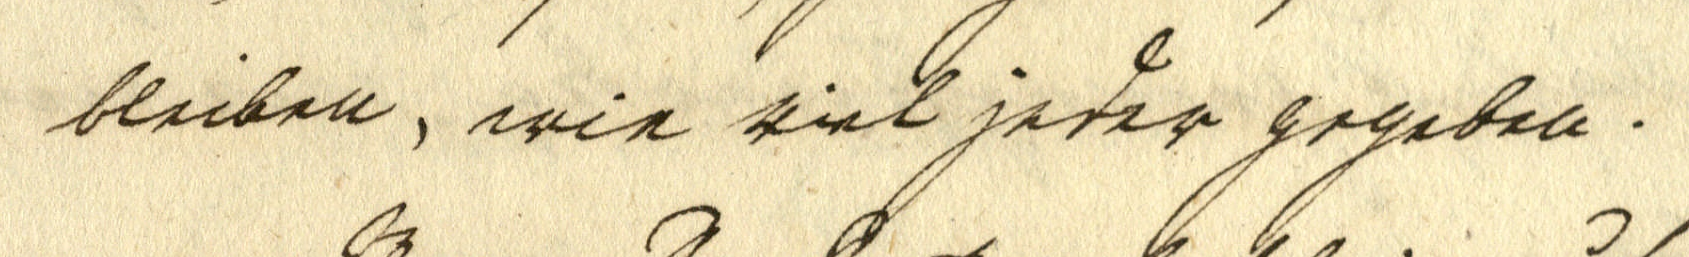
bleiben, wie viel jeder gegeben.
